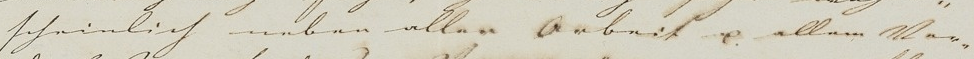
scheinlich neben aller Arbeit & allem Ver-
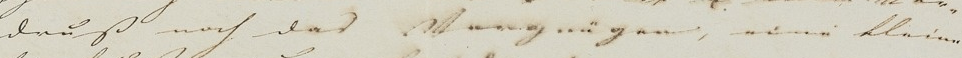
druß noch das Vergnügen, eine kleine
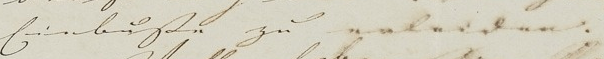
Einbuße zu erleiden.
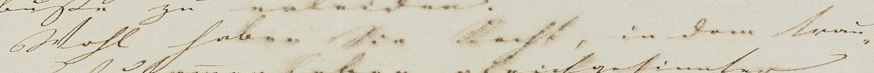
Wohl haben Sie Recht, in dem trau-
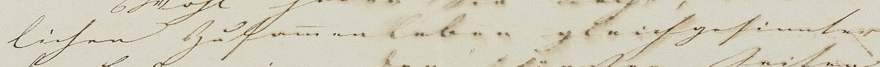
lichen Zusammenleben gleichgesinnter
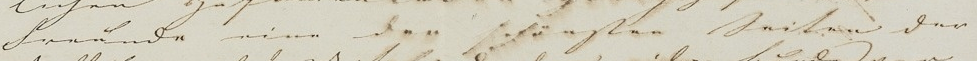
Freunde eine der schönsten Seiten der
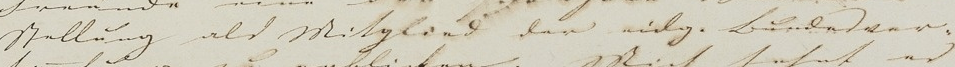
Stellung als Mitglied der eidg. Bundesver-
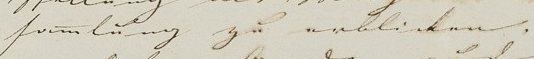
sammlung zu erblicken.
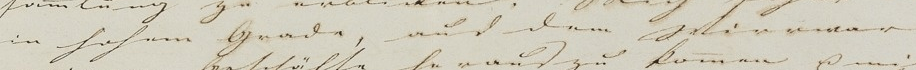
in hohem Grade, aus dem Wirrwar
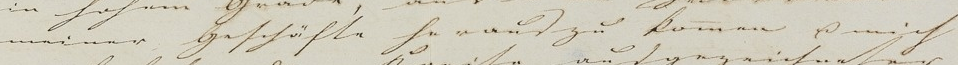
meiner Geschäfte heraus zu kommen & mich
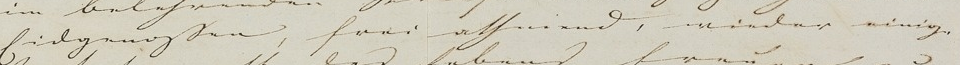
Eidgenossen, frei athmend, wieder einige
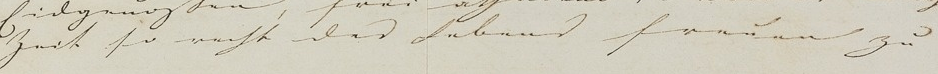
Zeit so recht des Lebens freuen zu
